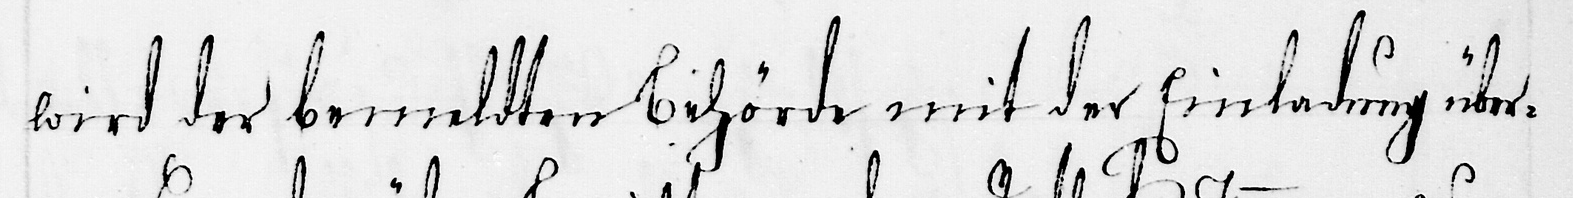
wird der bemeldten Behörde mit der Einladung über¬
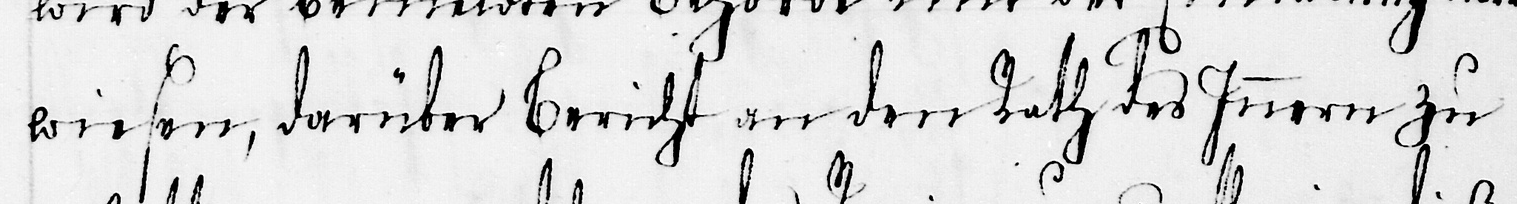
wiesen, darüber Bericht an den Rath des Innern zu
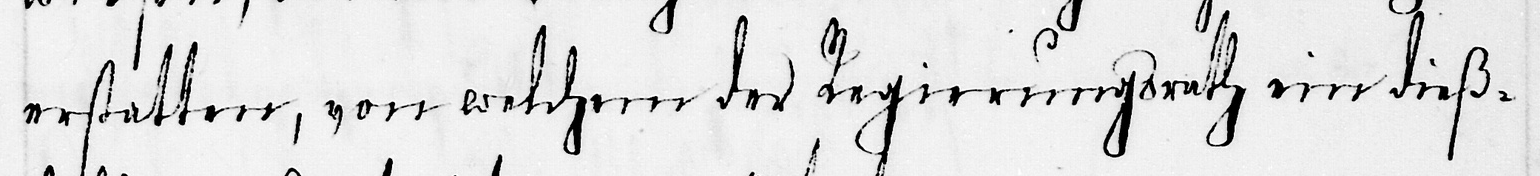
erstatten, von welchem der Regierungsrath ein dieß¬
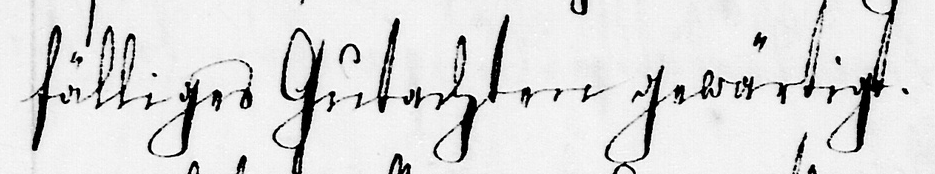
fälliges Gutachten gewärtigt.
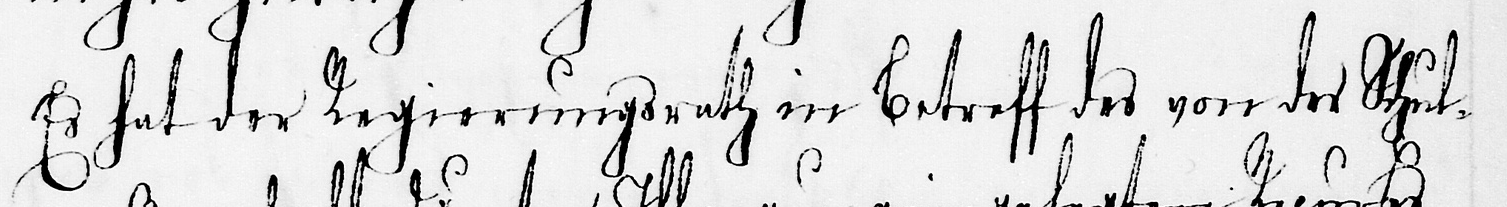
Es hat der Regierungsrath in Betreff des von der Schul¬
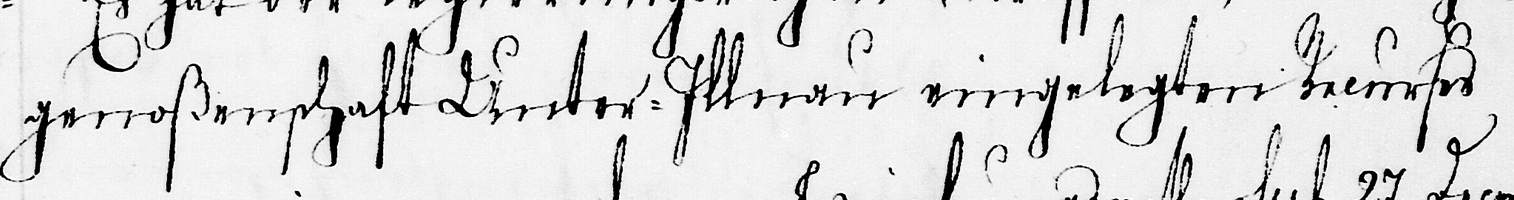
genoßenschaft Unter-Illnau eingelegten Recurses
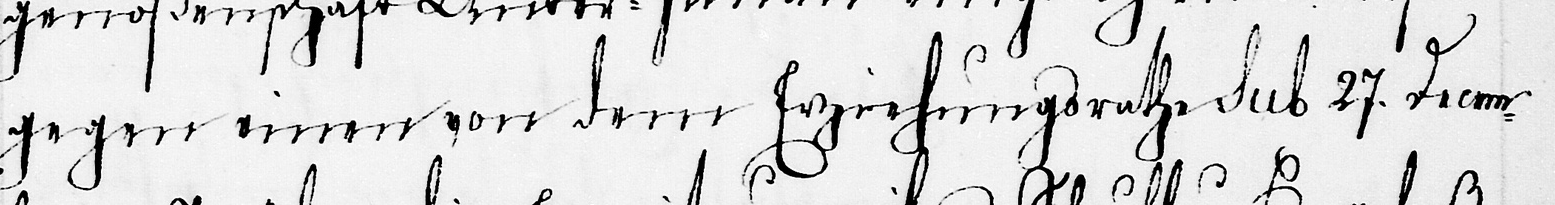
gegen einen von dem Erziehungsrathe sub 27. Decem¬
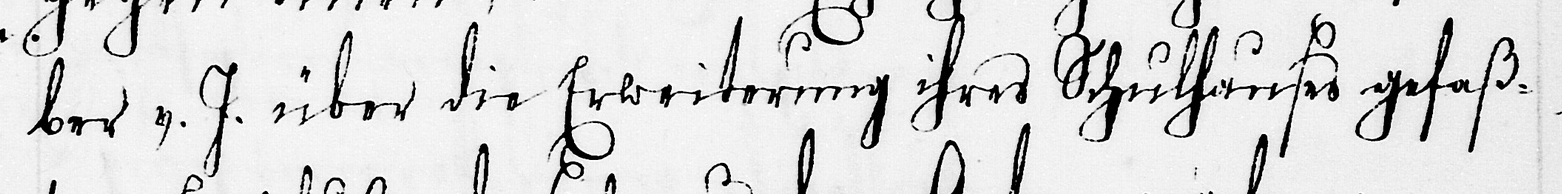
ber v. J. über die Erweiterung ihres Schulhauses gefaß¬
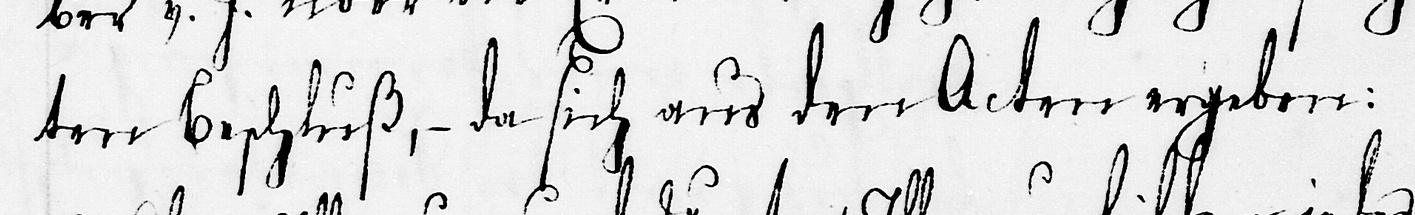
ten Beschluß, – da sich aus den Acten ergeben:
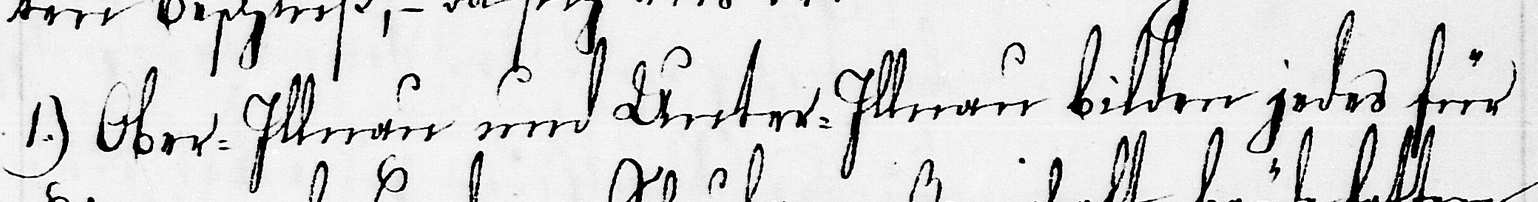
1.) Ober-Illnau und Unter-Illnau bilden jedes für
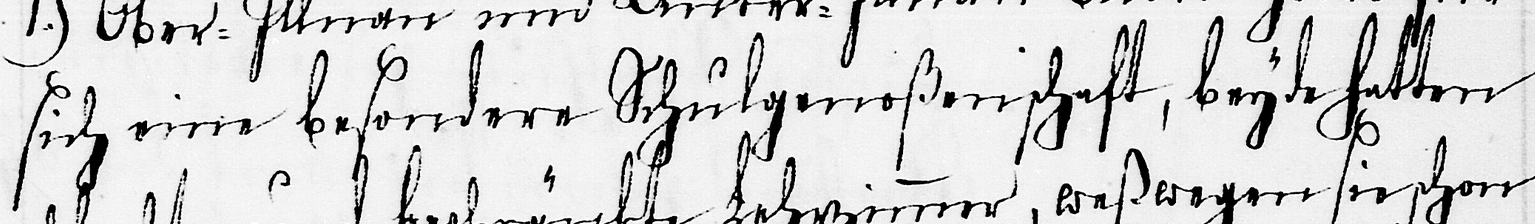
sich eine besondere Schulgenoßenschaft, beyde hatten
